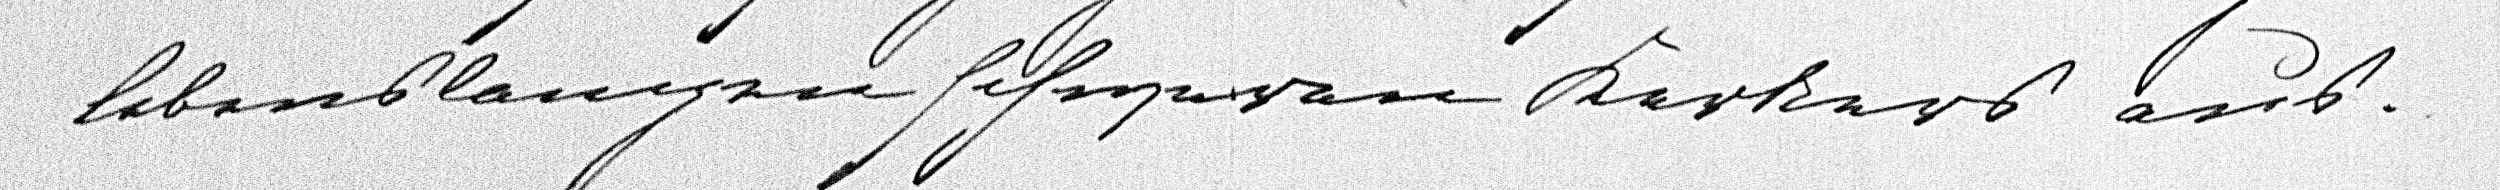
lebenslangen schweren Kerkers aus.
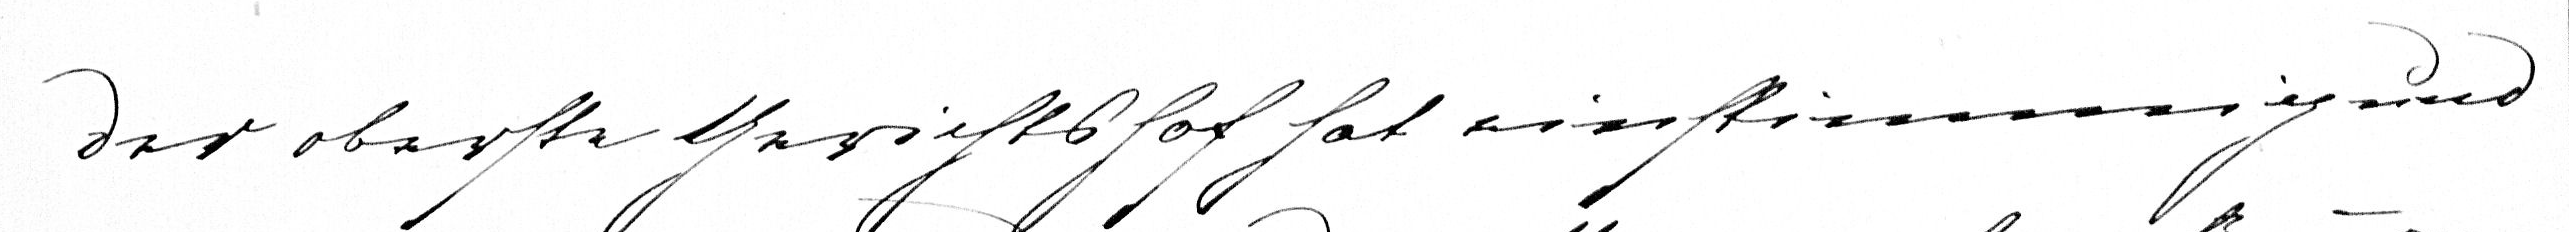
Der oberste Gerichtshof hat einstimmig und
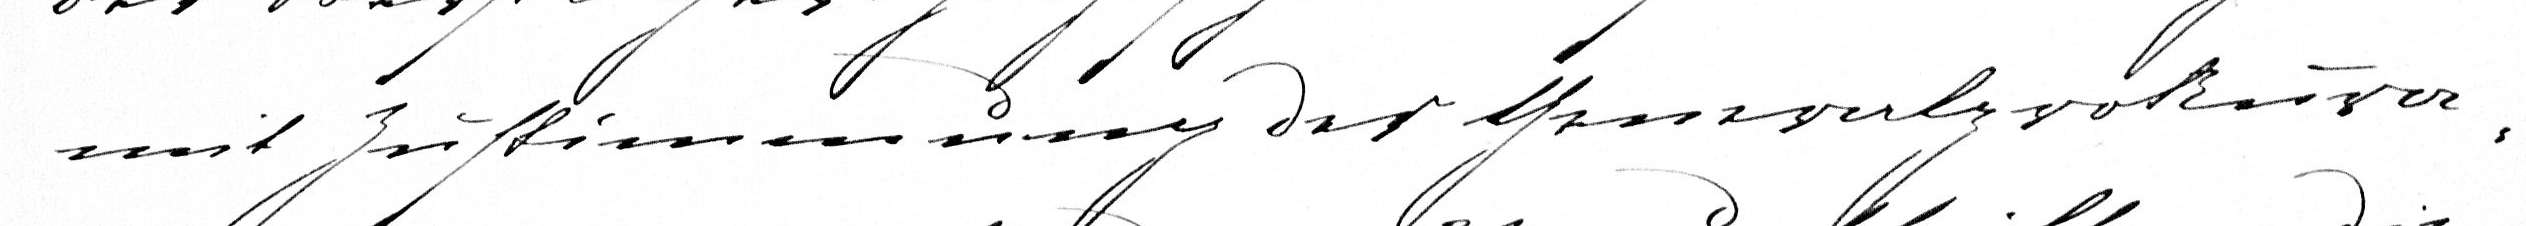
mit Zustimmung der Generalprokura¬
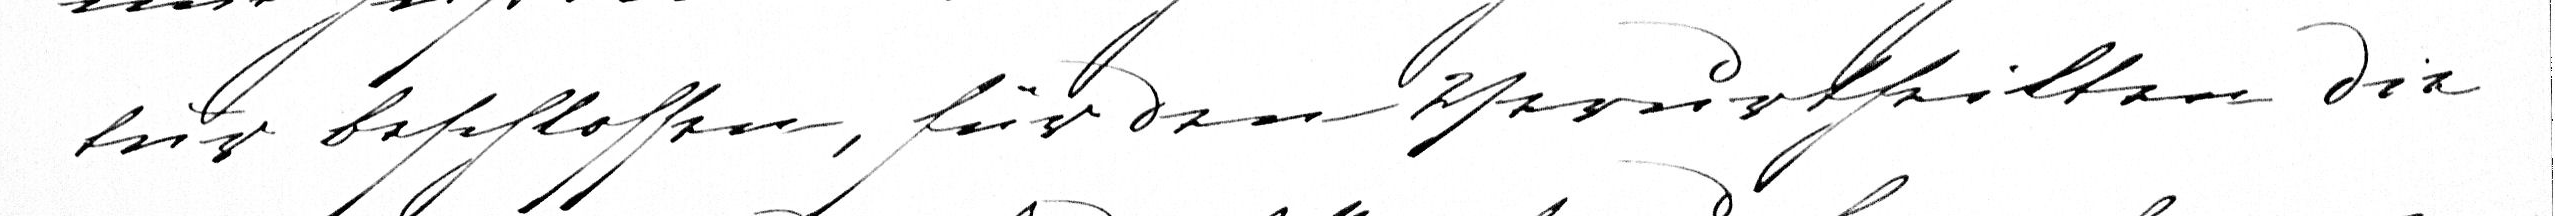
tur beschlossen, für den Verurtheilten die
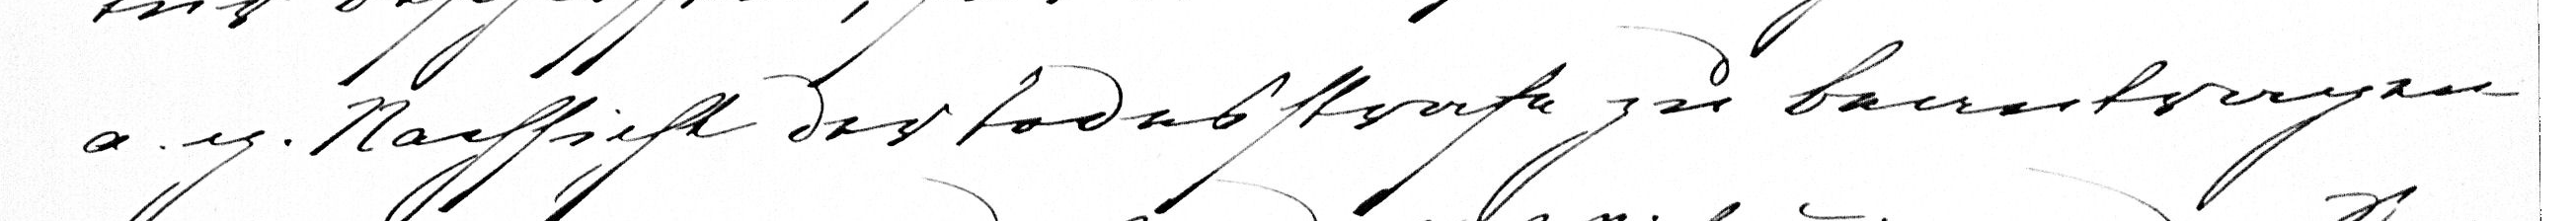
a.g. Nachsicht der Todesstrafe zu beantragen
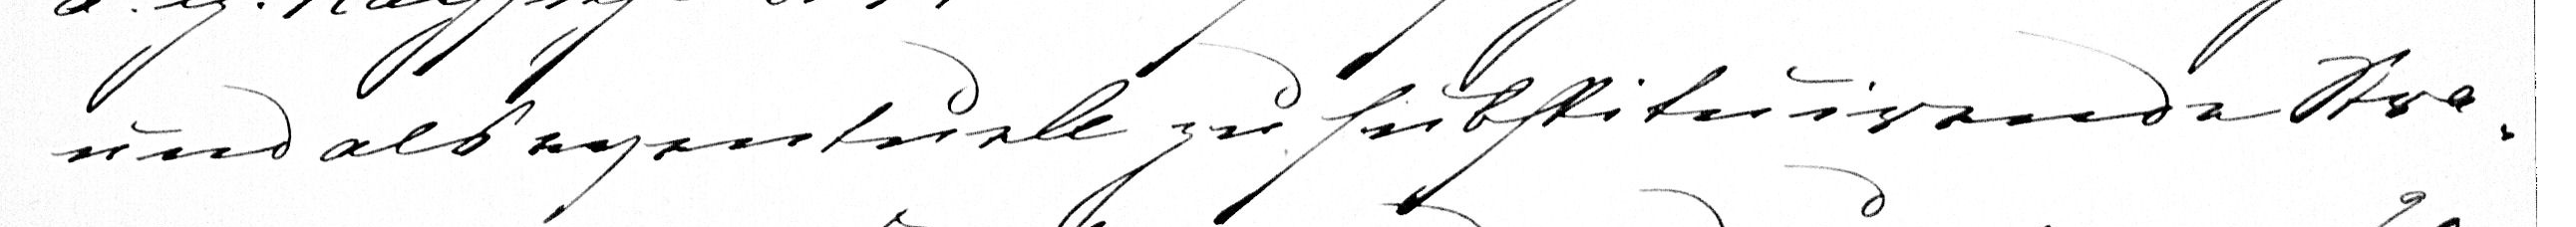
und als eventuele zu substituirende Stra¬
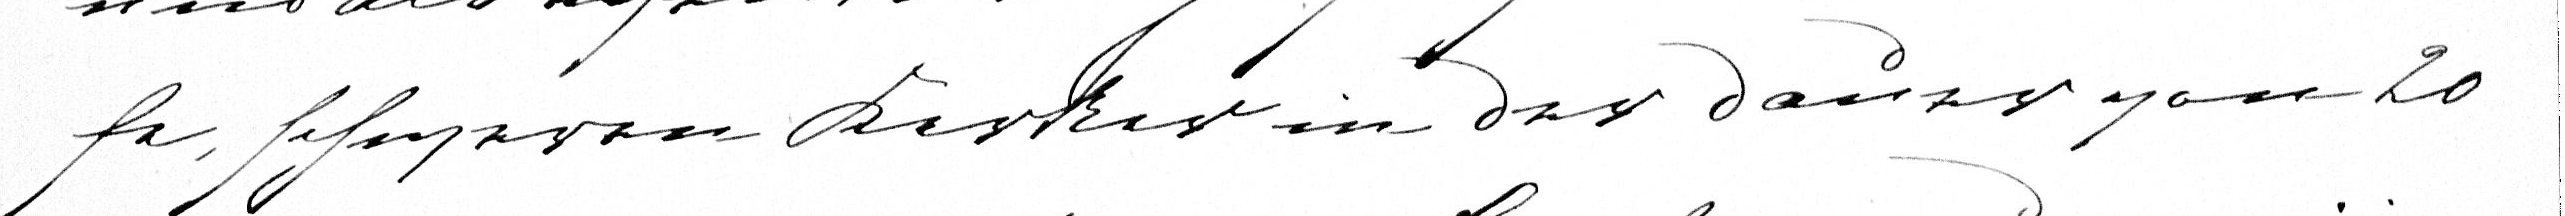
fe, schweren Kerker in der Dauer von 20
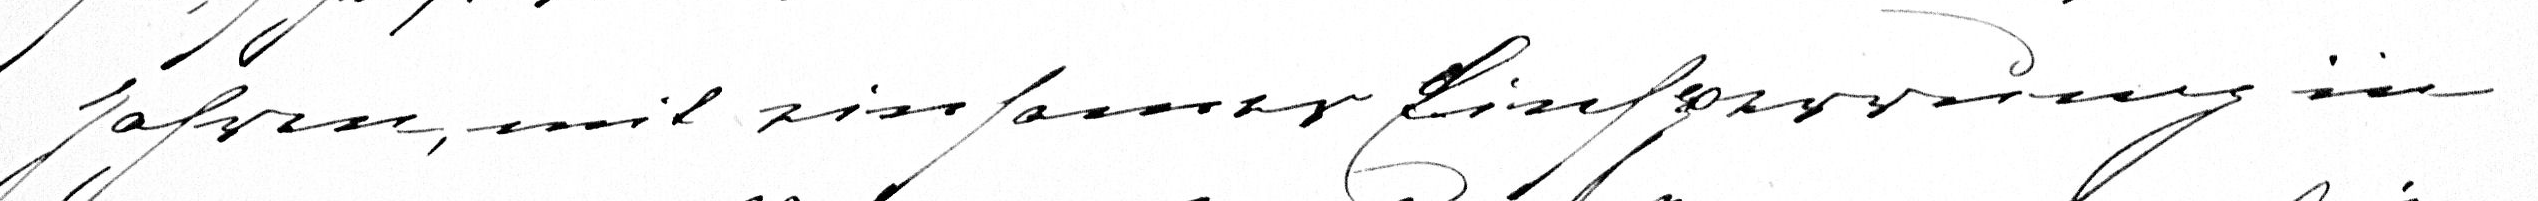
Jahren, mit einsamer Einsperrung in
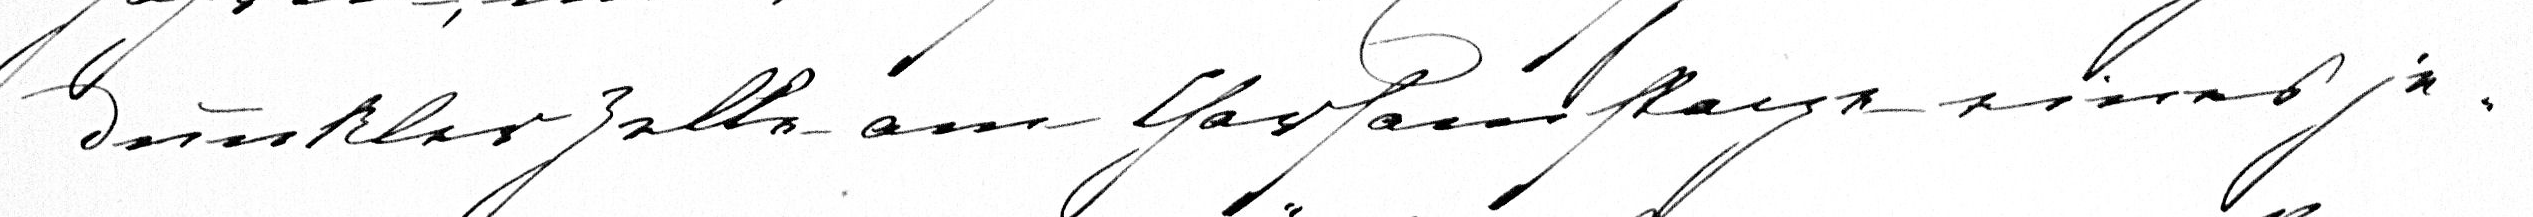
dunkler Zelle am xxarsamstage eines je¬
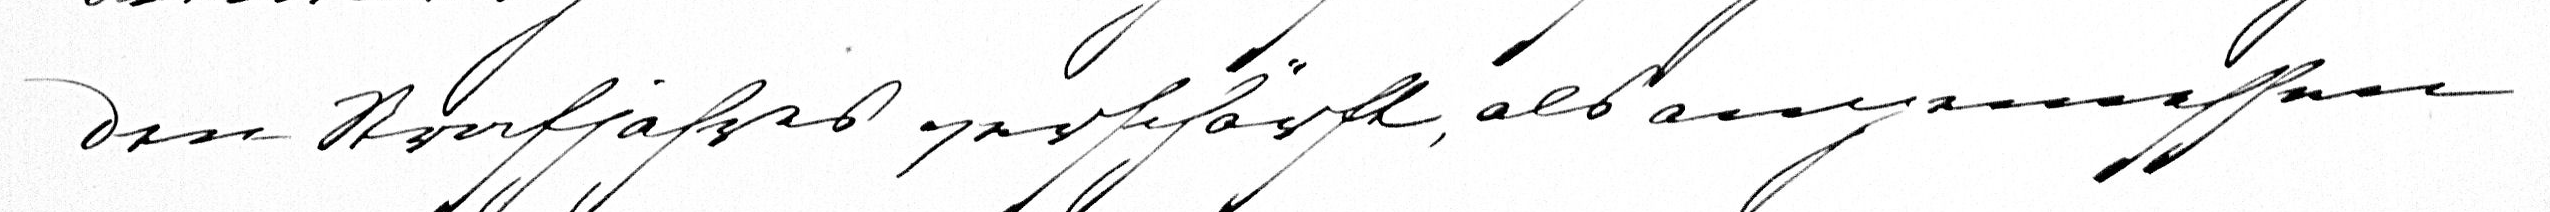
den Strafjahres verschärft, als angemessen
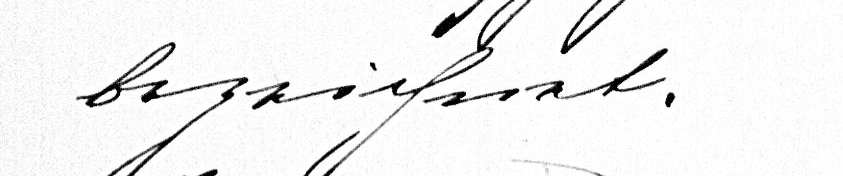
bezeichnet.
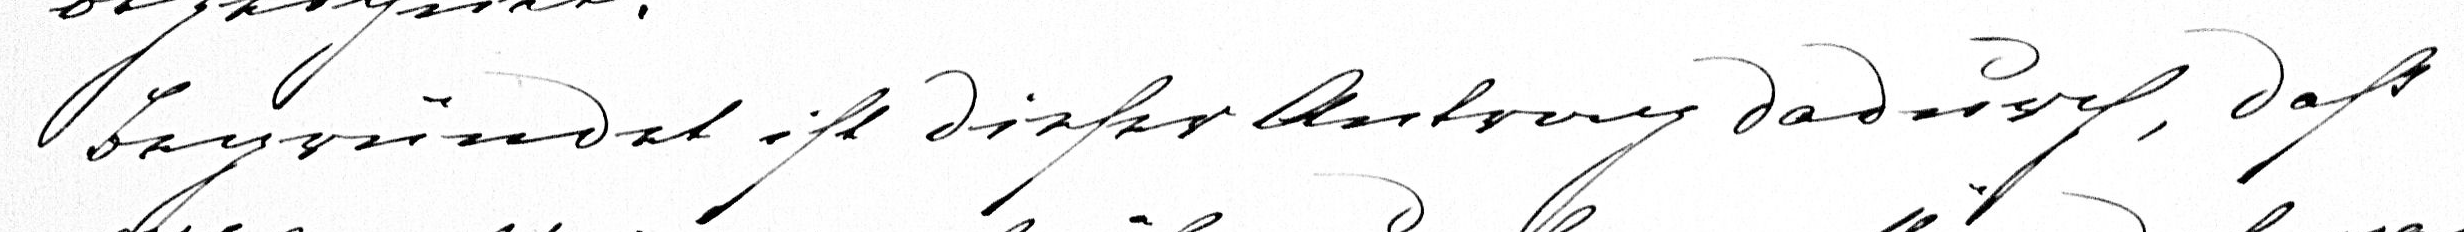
Begründet ist dieser Antrag dadurch, daß
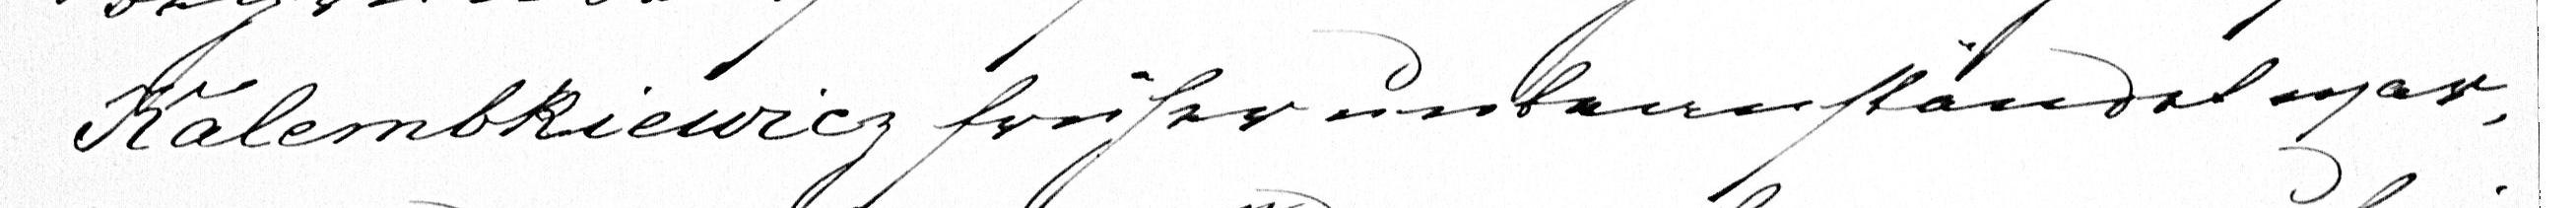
Kalembkiewicz früher unbeanständet war,
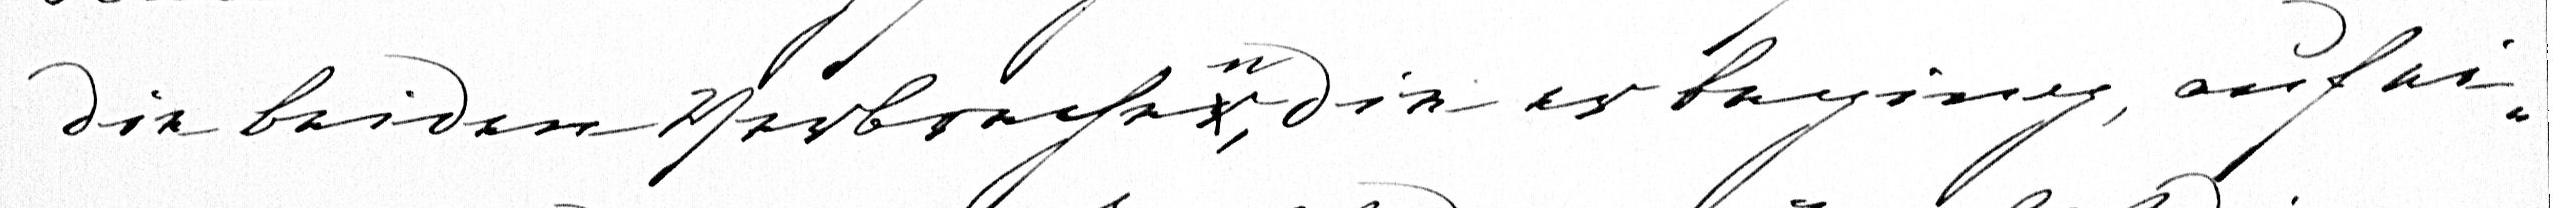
die beiden Verbrechen, die er beging, auf ei¬
